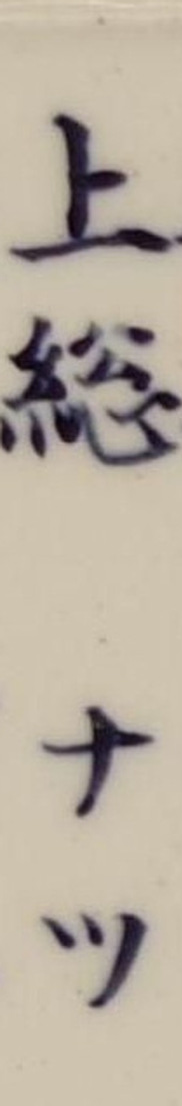上総ナツ

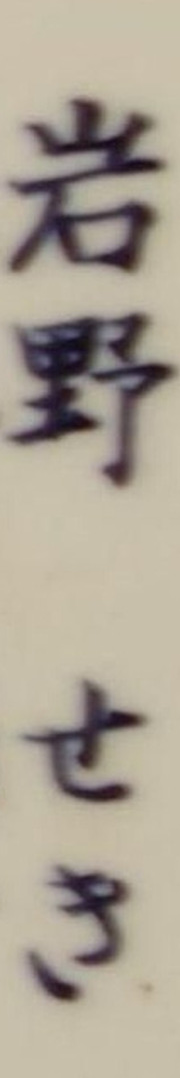岩野せき
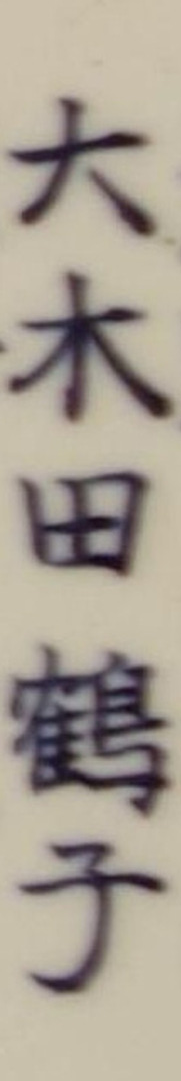大木田鶴子
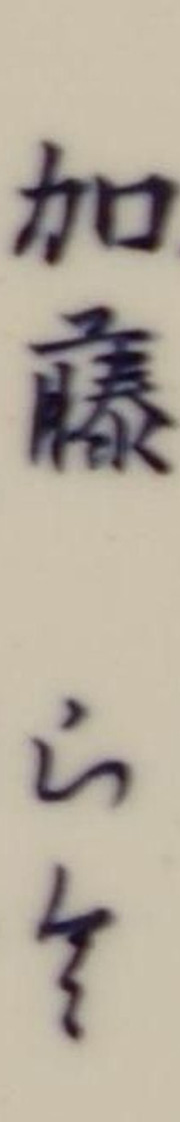加藤らく
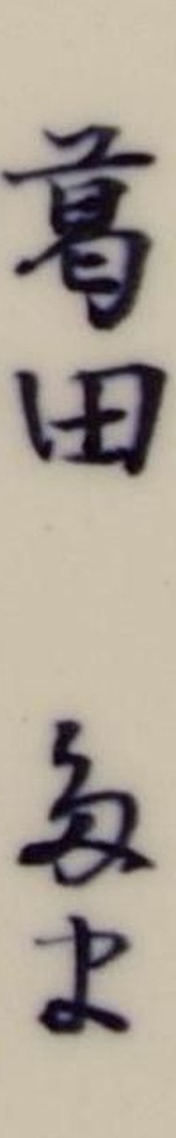葛田たま
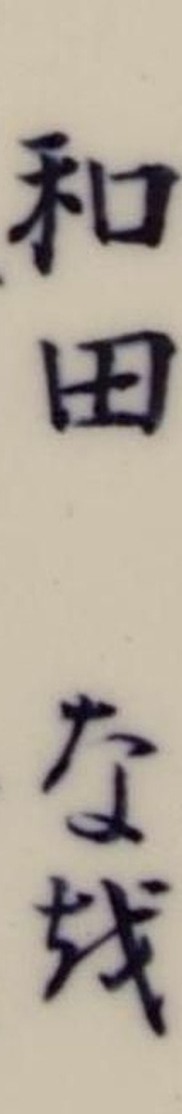和田なを
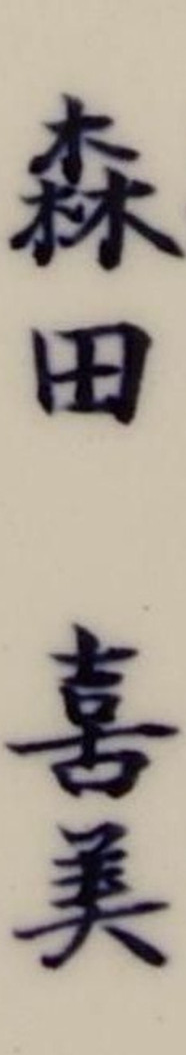森田喜美
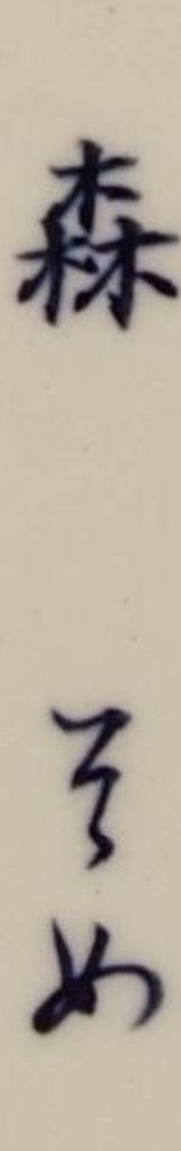森そめ
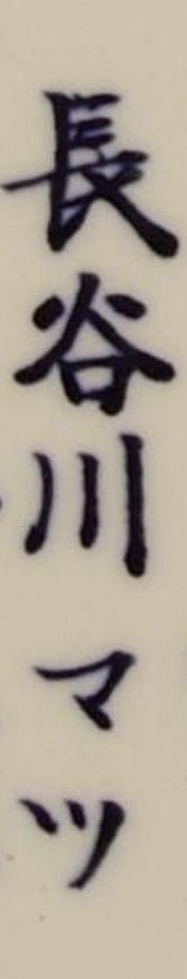長谷川マツ
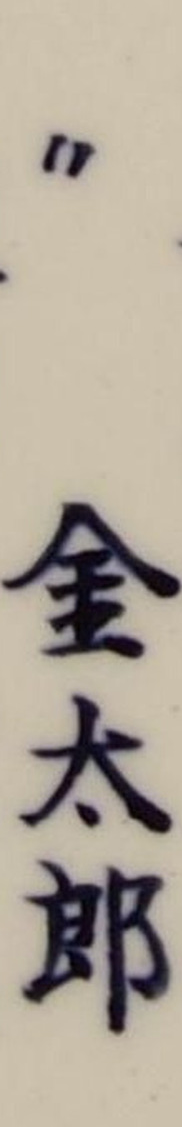金太郎
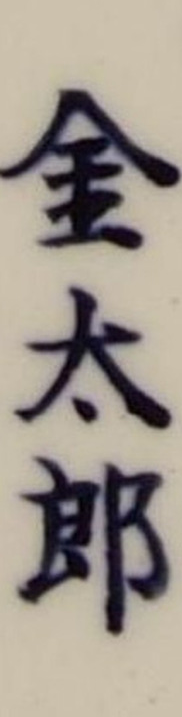金太郎
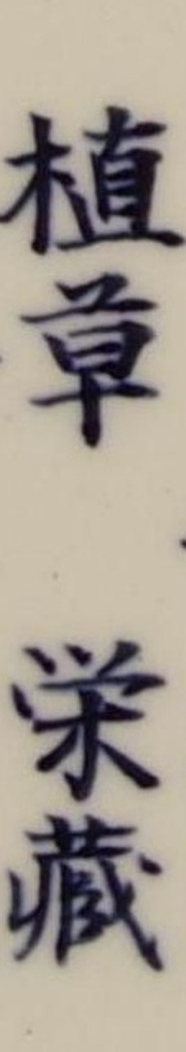植草栄蔵
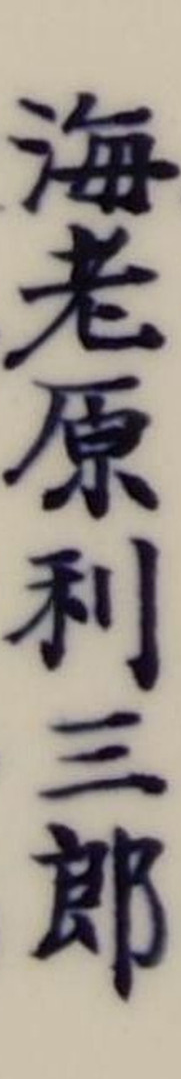海老原利三郎
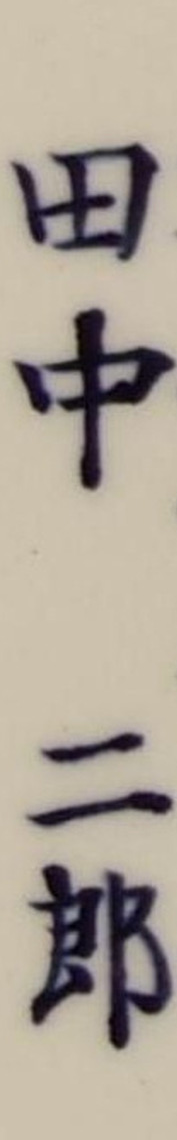田中二郎
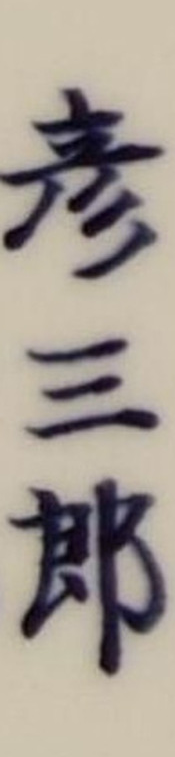彦三郎
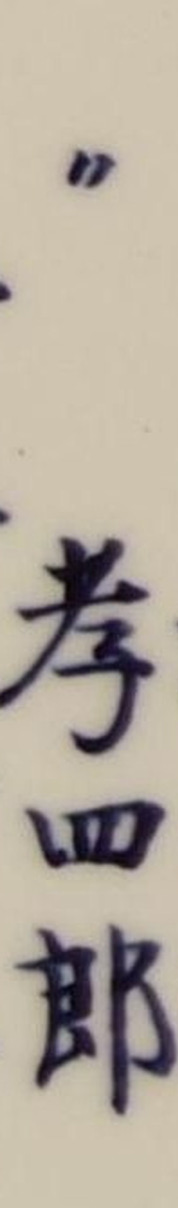孝四郎
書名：M~S
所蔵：高野山金剛峯寺
